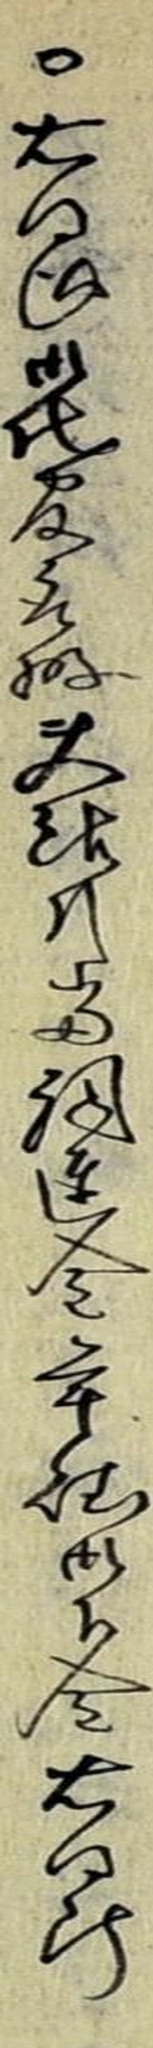○右同趣御代官取扱夫銀引当調達金年賦御下金右同断
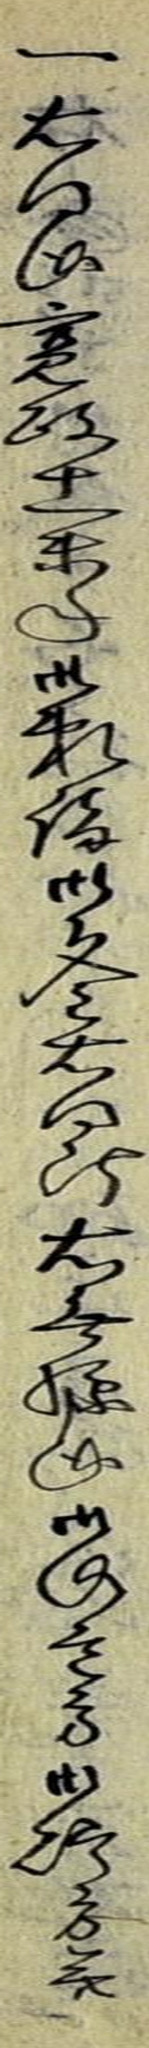一右同趣寛政十一未年御頼講御下金右同断右無拠趣御趣意方御貯方并
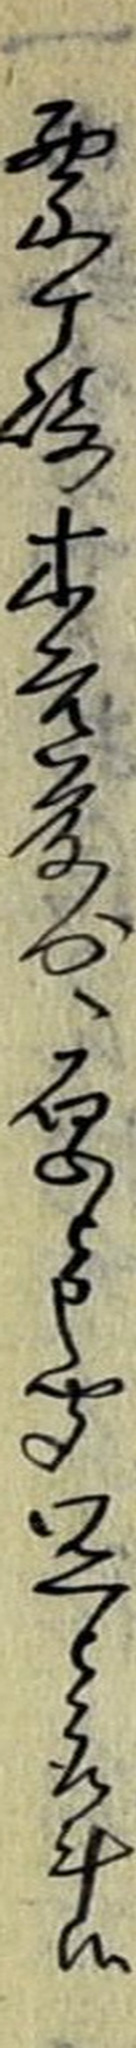粟ヶ崎木谷藤右衛門へ厚被申聞宜被取斗候
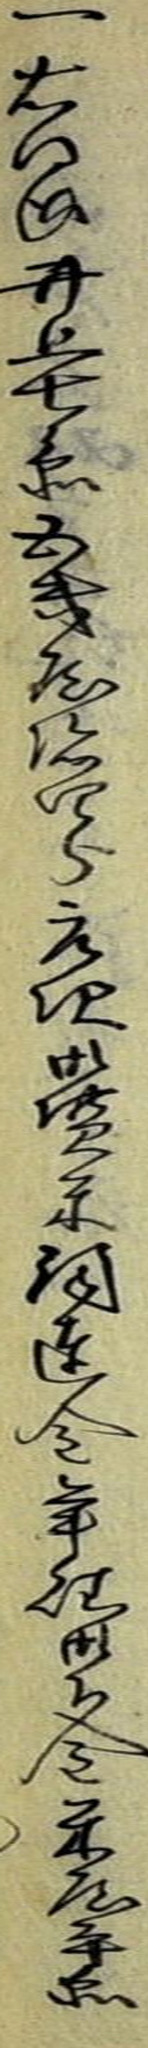一右同趣井上七兵衛五幾屋弥四郎取次御貸米調達金年賦御下金米屋平兵衛
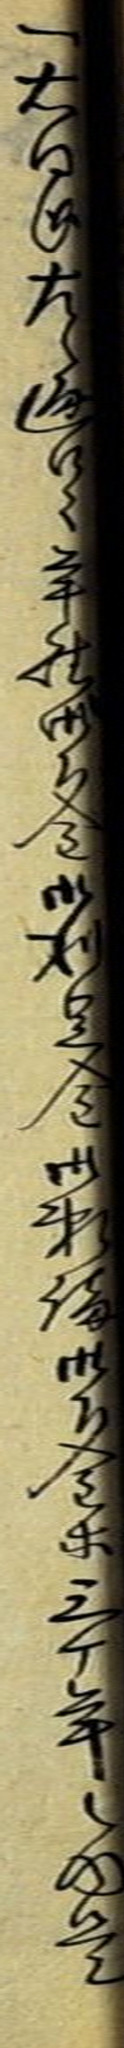一右同趣右之通口々年賦御下金御利息金御頼講御下金等三ヶ年之内是
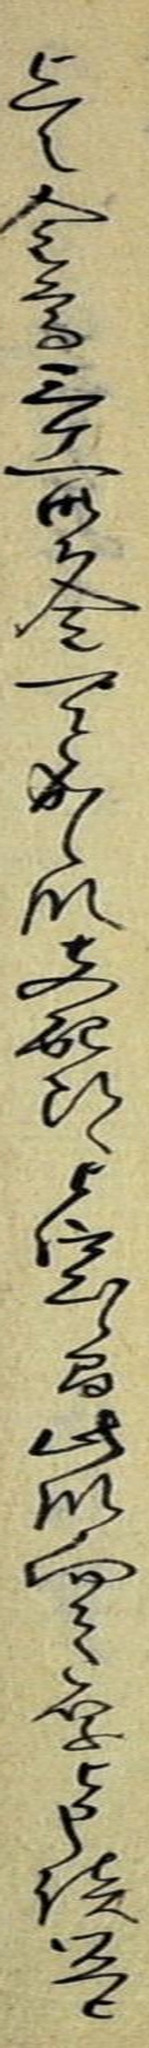迄之金高三ヶ一御下金可被成候段支配頭へ被仰出候間此段向々へ厚被申談宜被
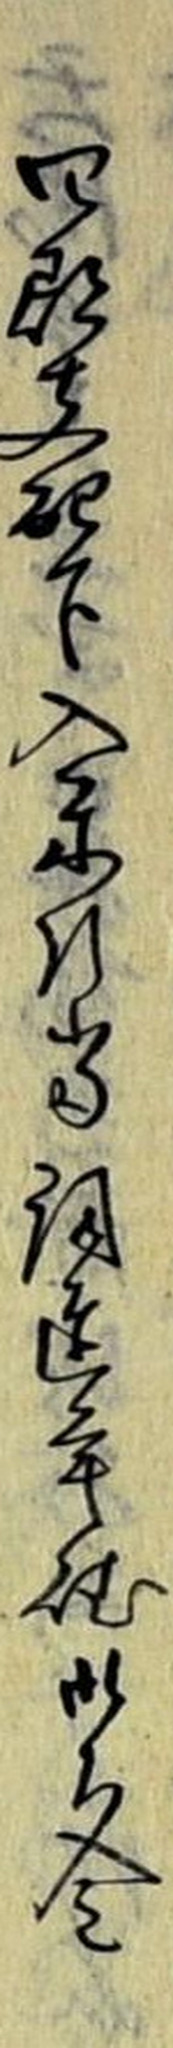四郡支配下入米引当調達年賦御下金
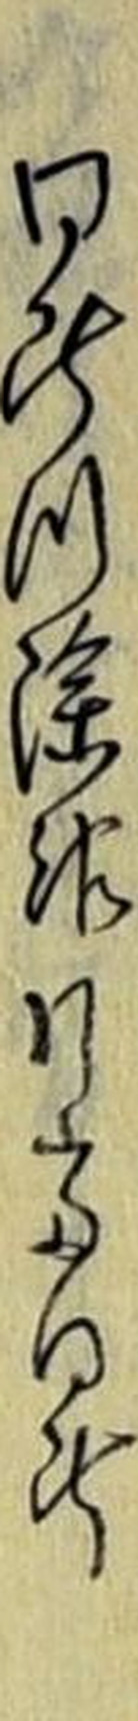同断川除銀引当同断
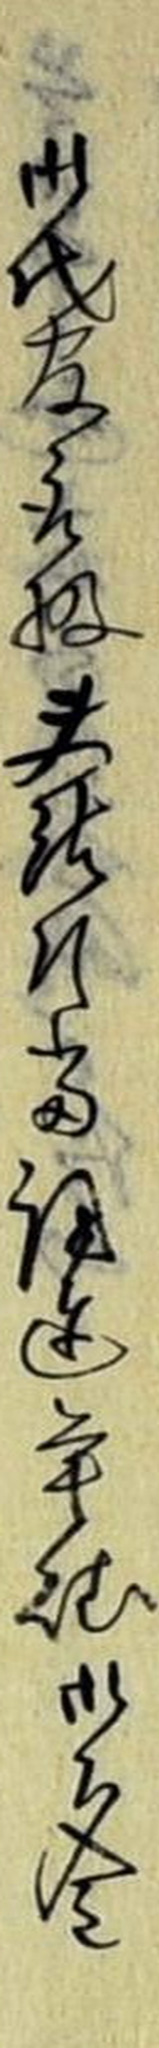御代官取扱夫銀引当調達年賦御下金
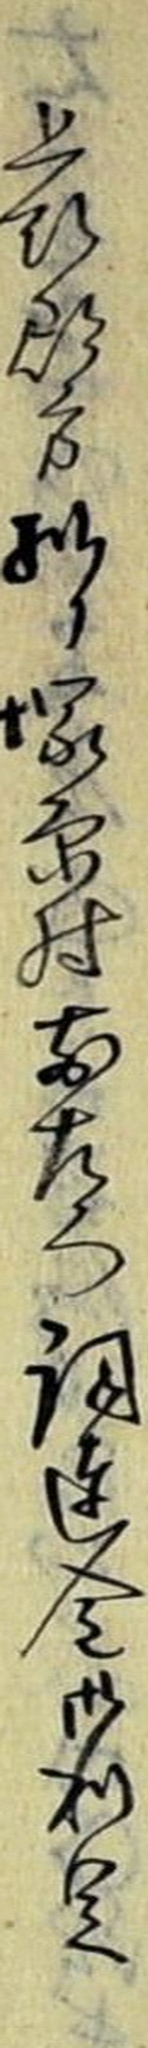上領郡方掛り塚原村前左衛門調達金御利息
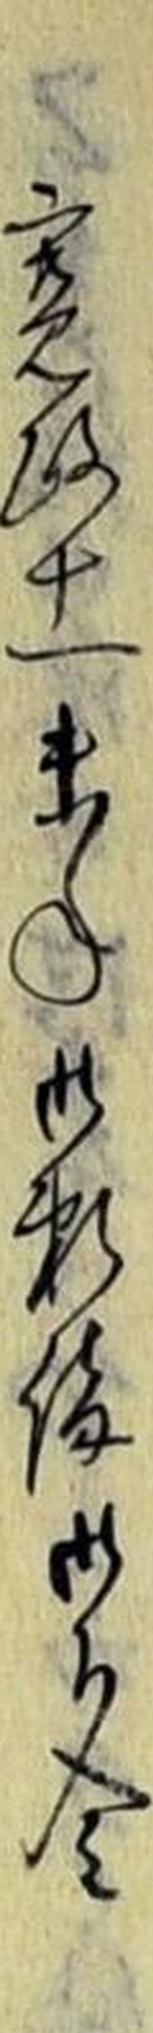寛政十一未年御頼講御下金
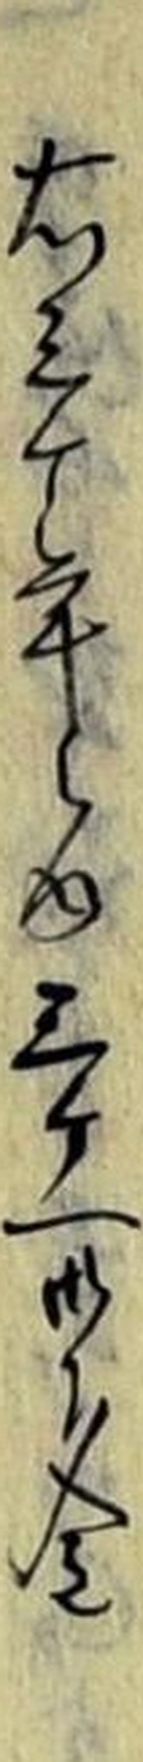右三ヶ年之内三ヶ一御下金
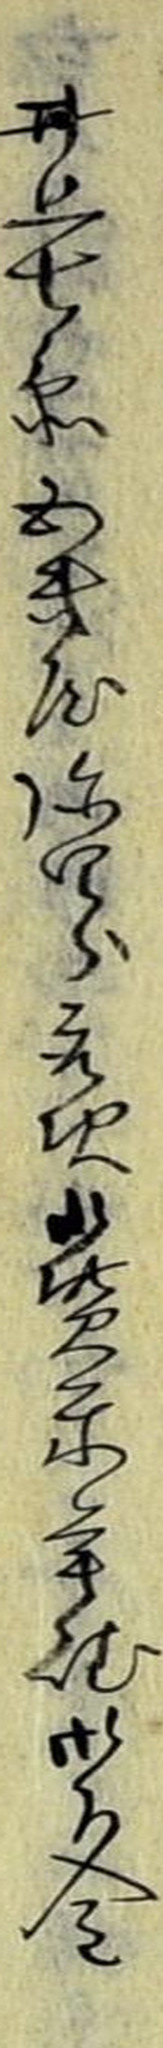井上七兵衛五幾屋弥四郎取次御貸米年賦御下金
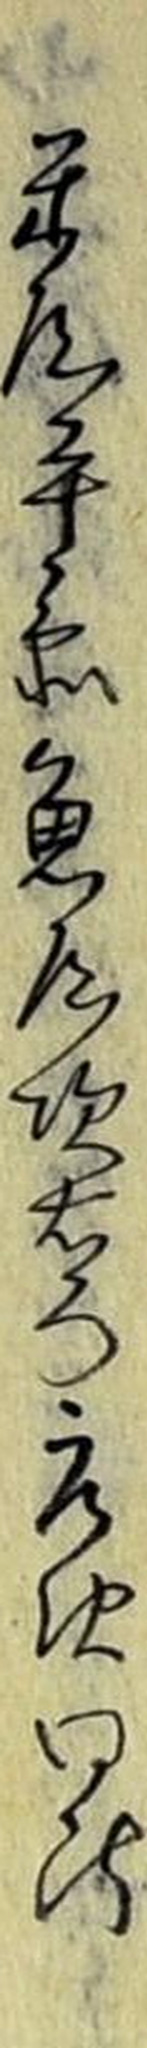米屋平兵衛魚屋次右衛門取次同断
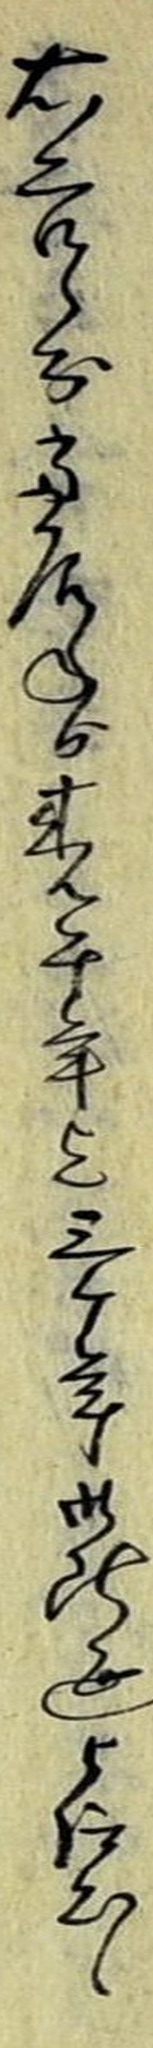右二口之分当辰年ゟ来ル午年迄三ヶ年御断延被仰付候
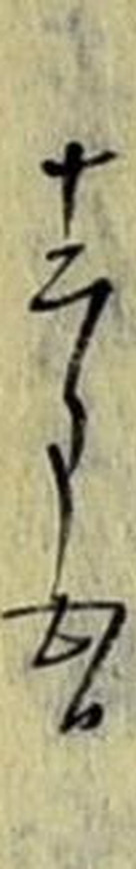十二月五日
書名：命令之部 四
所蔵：福井県文書館 Fukui Prefectural Archives
